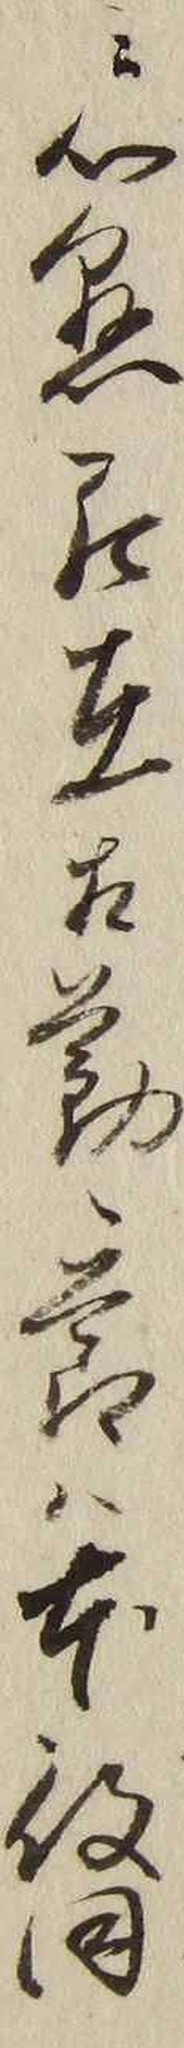ニ心懸罷在相勤候節ハ本役同

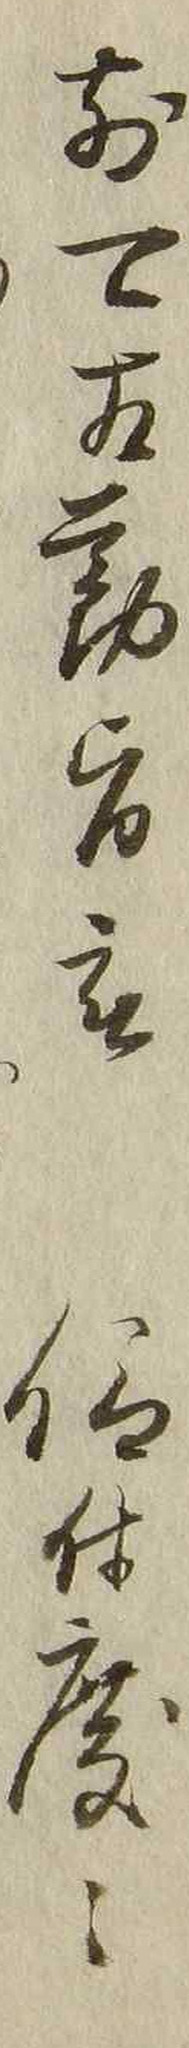前可相勤旨被仰付度々
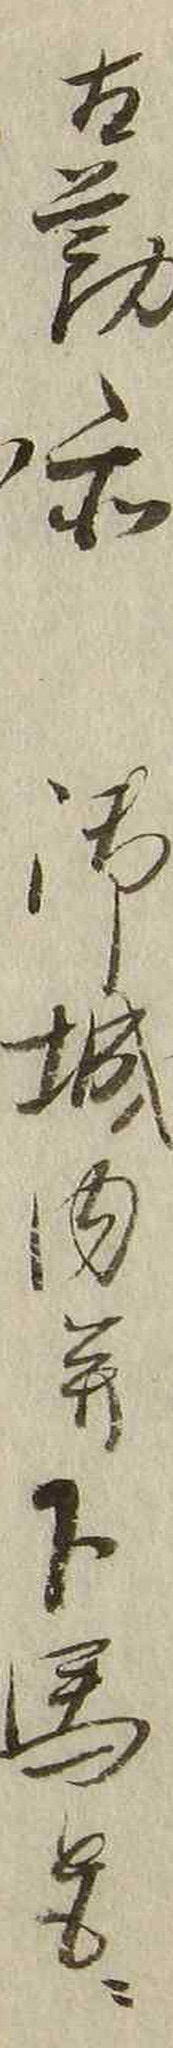相勤候所御城内并下馬ともニ
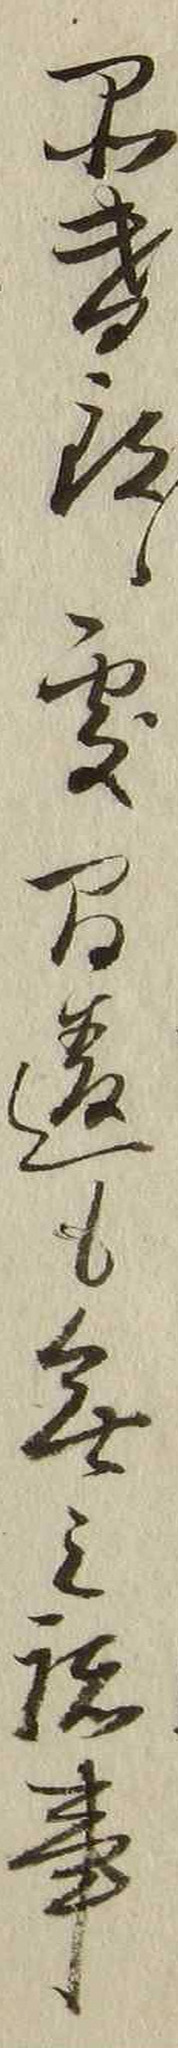品替致候処間違も無之諸事
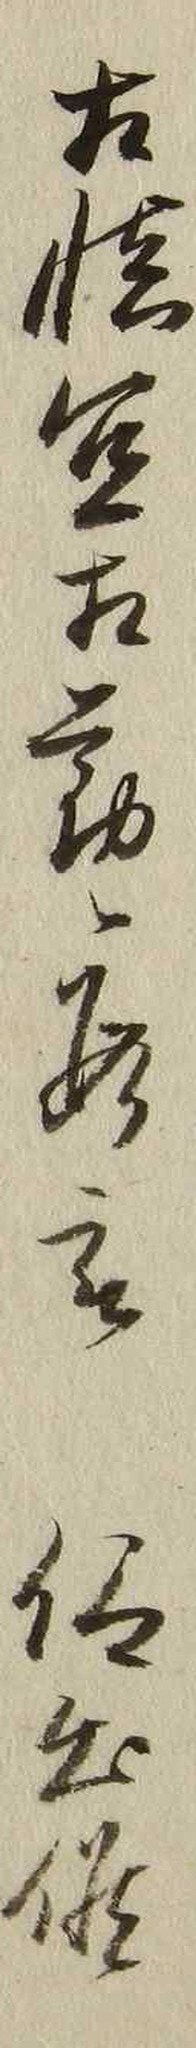相慎宜相勤候段被仰出候
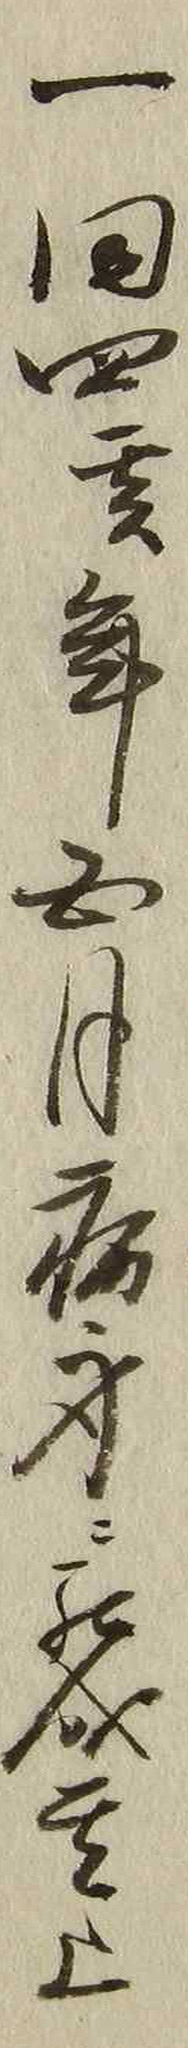一同四亥年五月病身ニ罷成其上
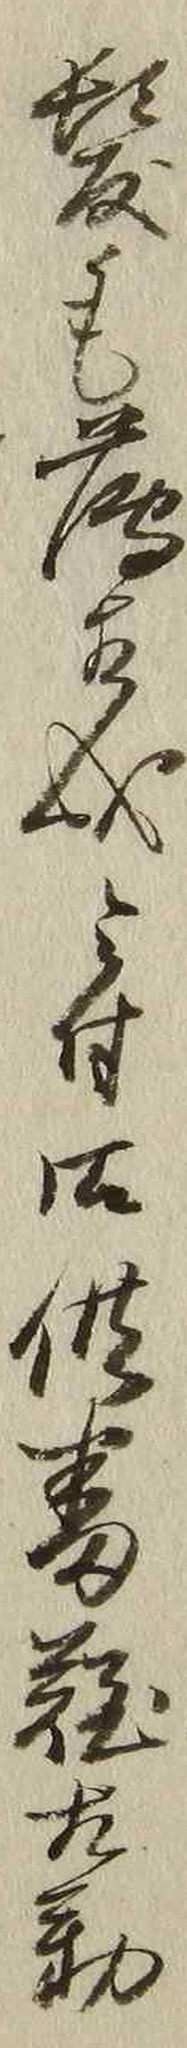髪も薄相成候ニ付御供番難相勤
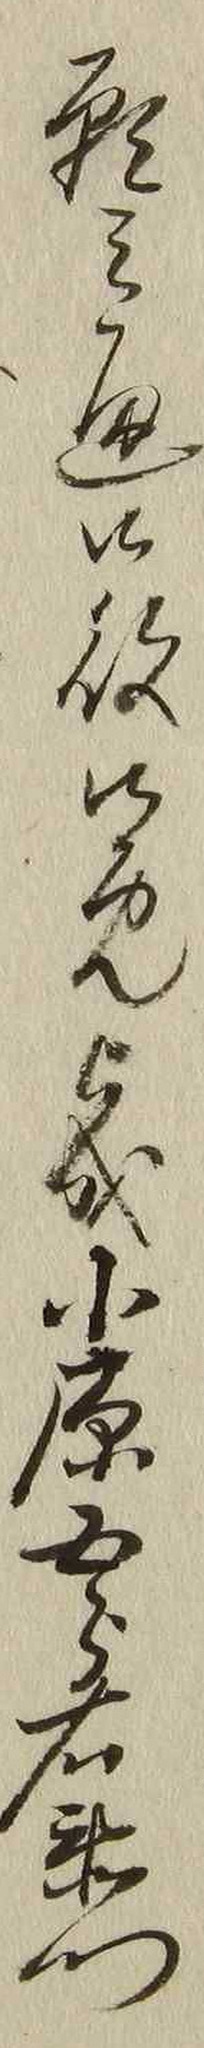願之通御役御免被成小原五郎右衛門
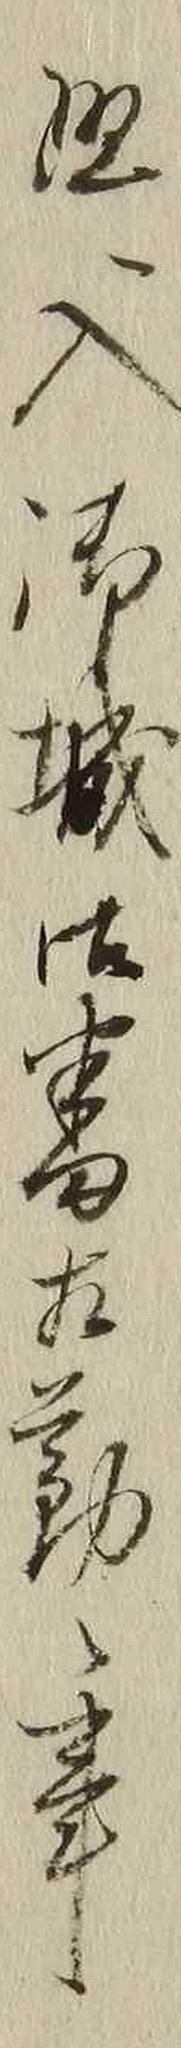組へ入御城御番相勤候事
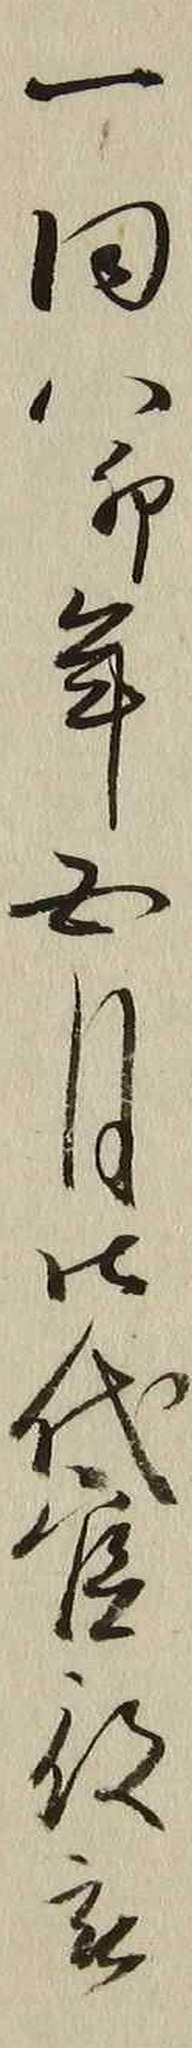一同八卯年五月御代官役被
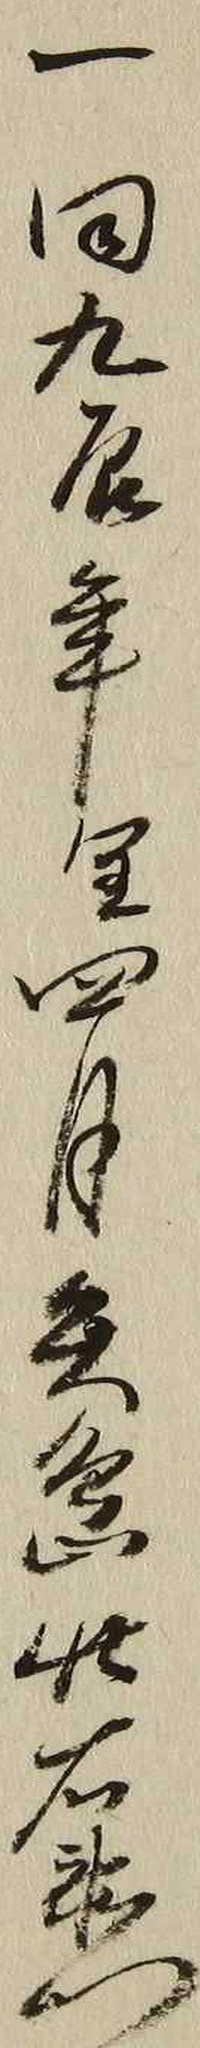一同九辰年閏四月矢島此右衛門
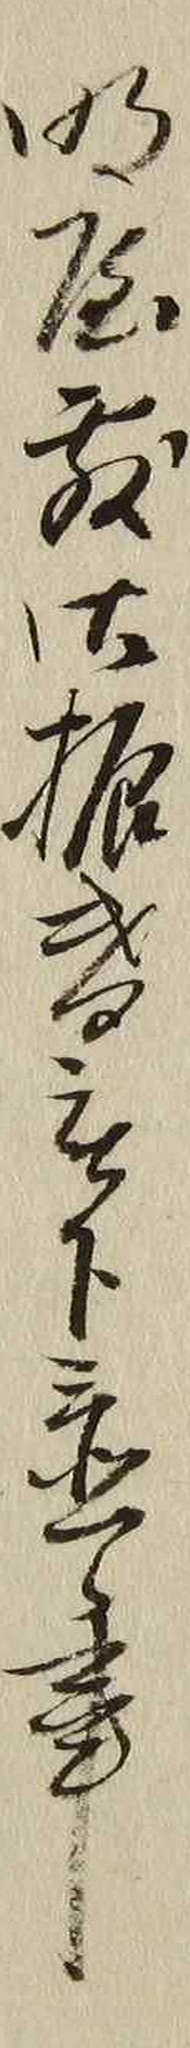明屋敷御振替被下置候事
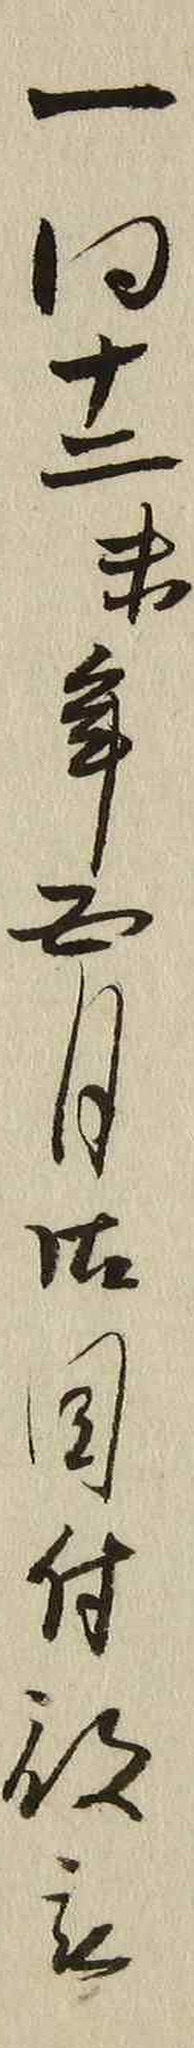一同十二未年五月御目付役被
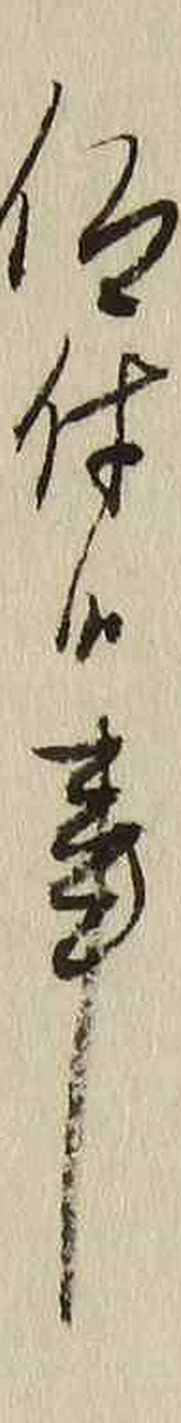仰付候事
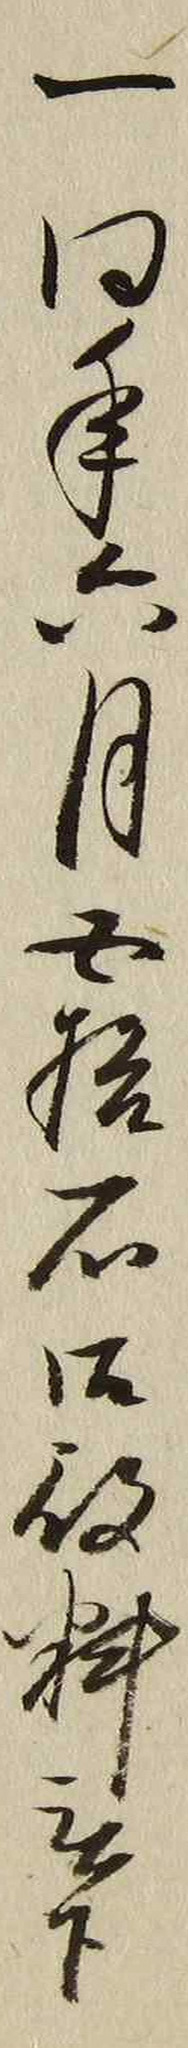一同年六月五拾石御役料被下
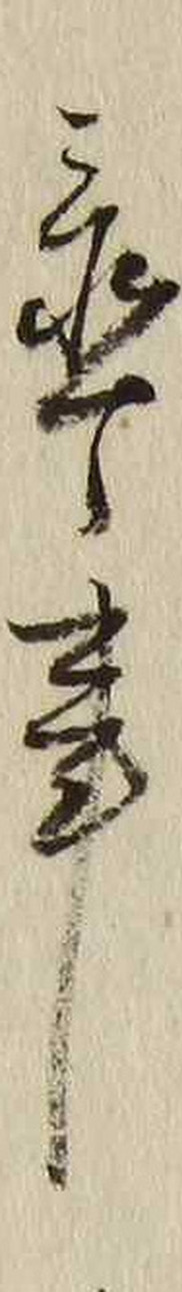置候事
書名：諸士系譜　巻之352　す之部2
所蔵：会津若松市立会津図書館
